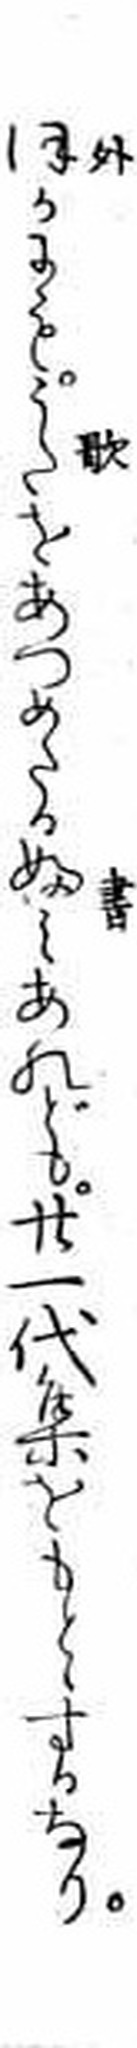ほかにも。うたをあつめたるふみあれども。廿一代集をもとゝするなり。
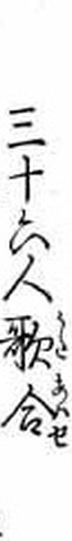三十六人歌合
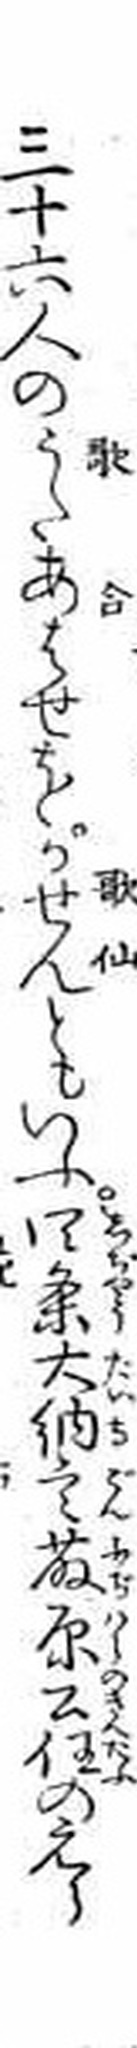三十六人のうたあはせを。かせんともいふ。四条大納言藤原公任のえら
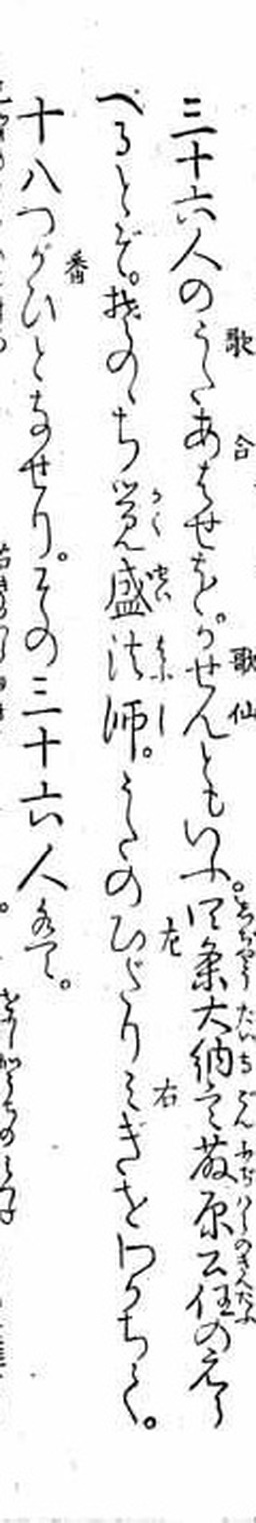べるとぞ。そのゝち覚盛法師。うたのひだりみぎをわかちて。
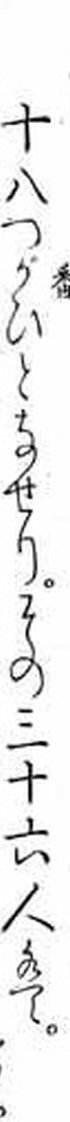十八つがひとなせり。その三十六人は。

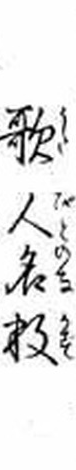歌人名数
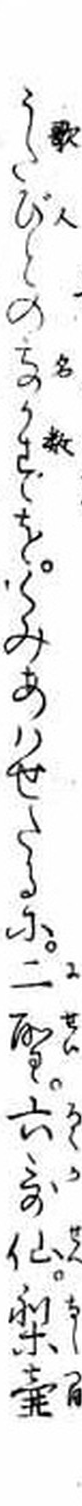うたびとのなかずを。くみあはせたるに。二聖。六哥仙。梨壺
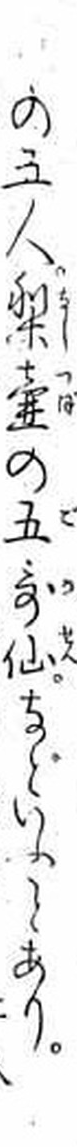の五人。梨壺の五哥仙などいふことあり。
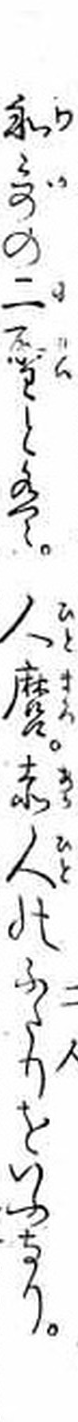和哥の二聖とは。人麿。赤人のふたりをいふなり。
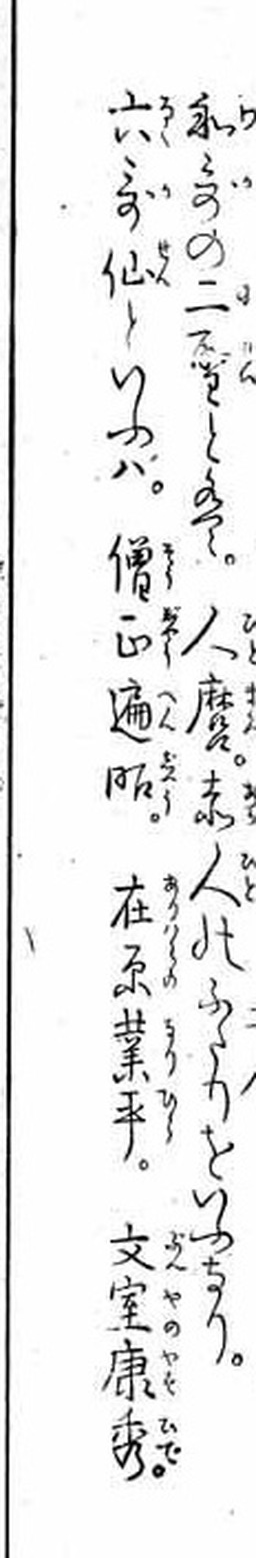六哥仙といふは。僧正遍照。在原業平。文屋康秀。
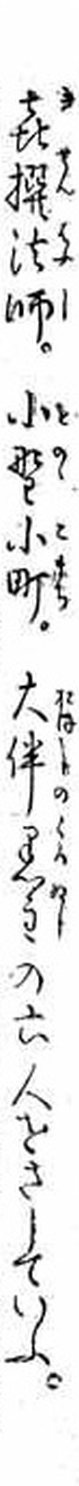喜撰法師。小野小町。大伴黒主の六人をさしていふ。
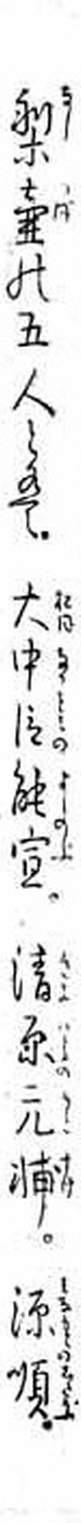梨壺の五人とは。大中臣能宣。清原元輔。源順。
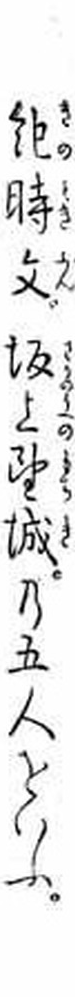紀時文。坂上望城。の五人をいふ。
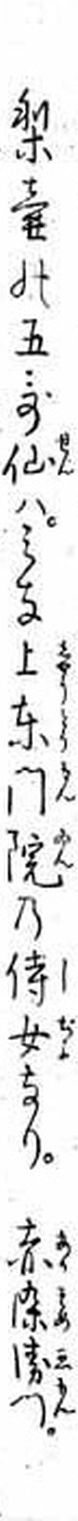梨壺の五哥仙は。みな上東門院の侍女なり。赤染衛門。
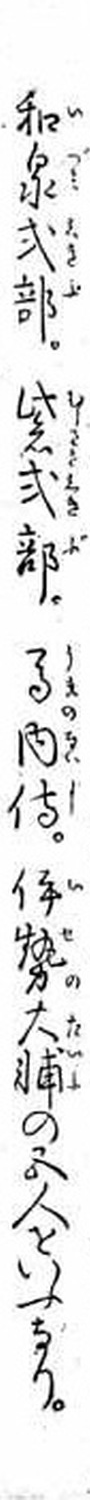和泉式部。紫式部。馬内侍。伊勢大輔の五人をいふなり。
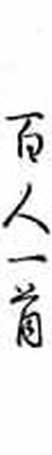百人一首
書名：女学範
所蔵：東京学芸大学教育コンテンツアーカイブ
